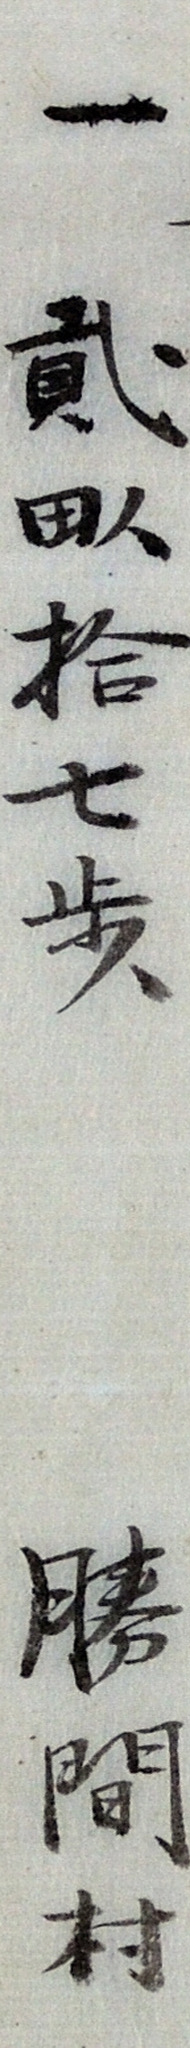一弐㽗拾七歩勝間村
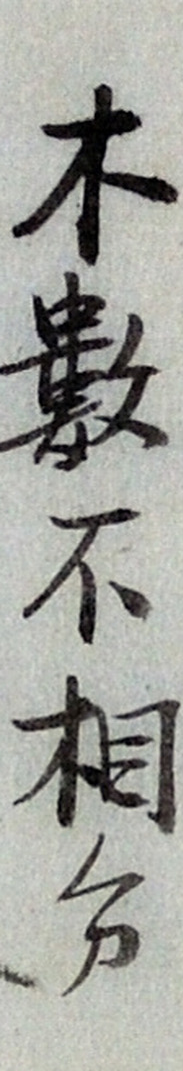木数不相分
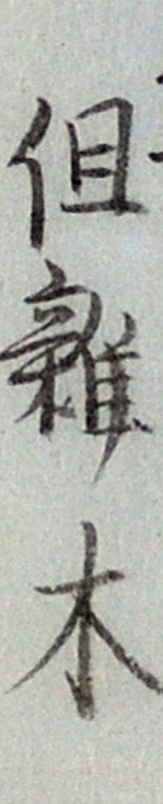但雑木
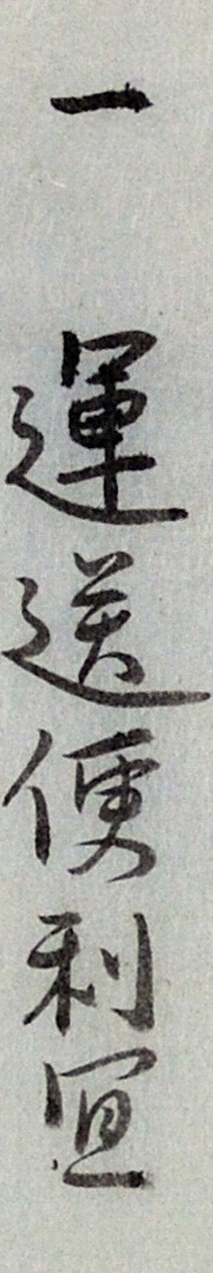一運送便利宜
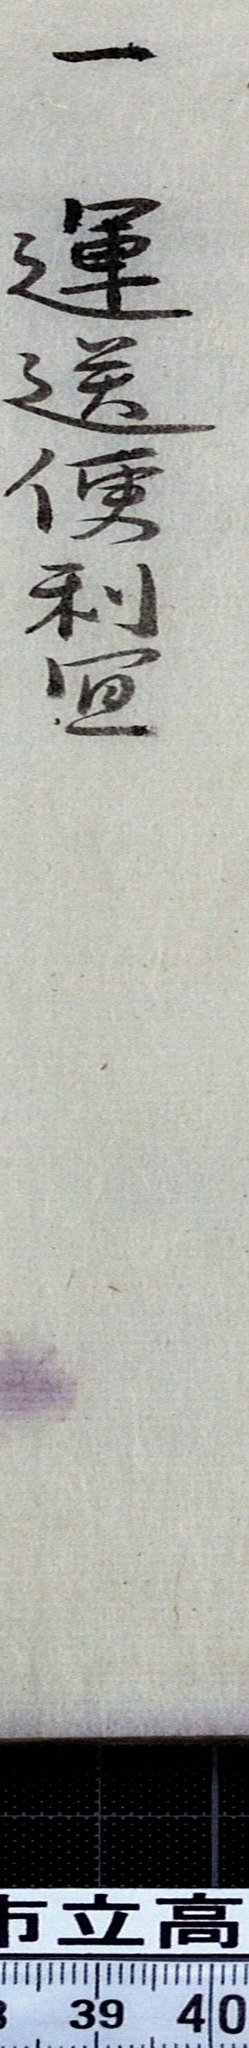一運送便利宜
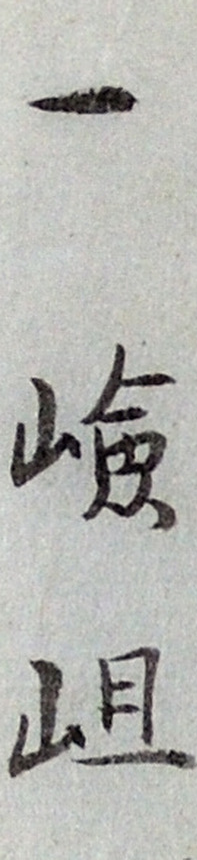一嶮岨

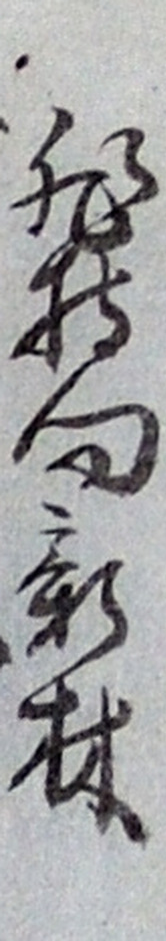非持向新林
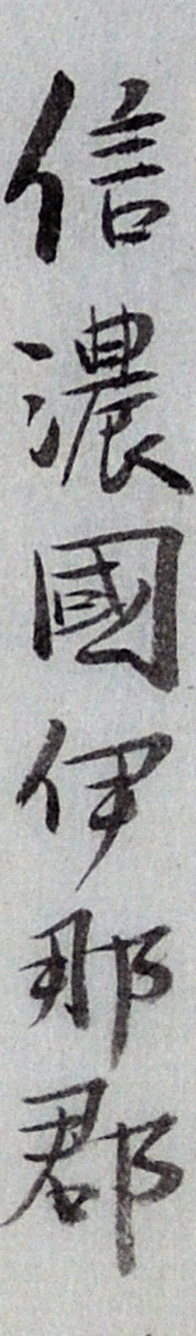信濃国伊那郡
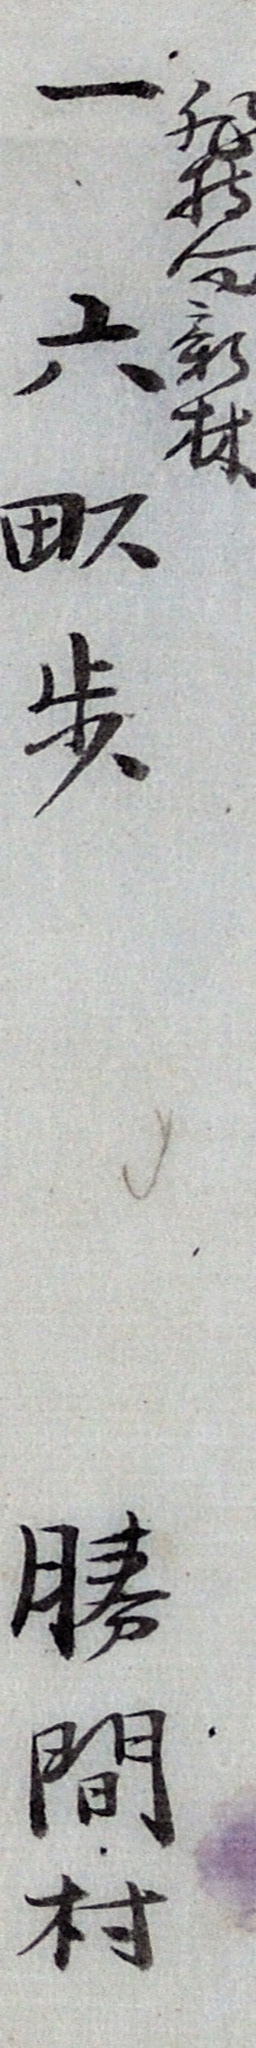一六㽗歩勝間村
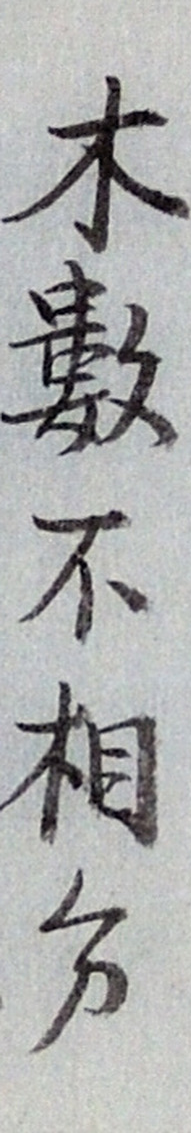木数不相分
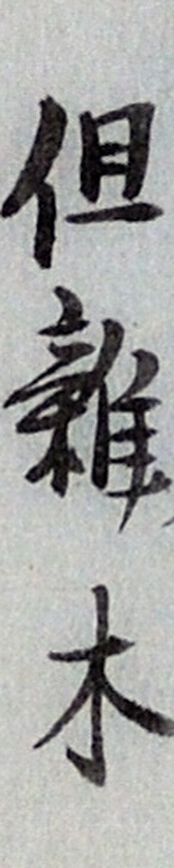但雑木
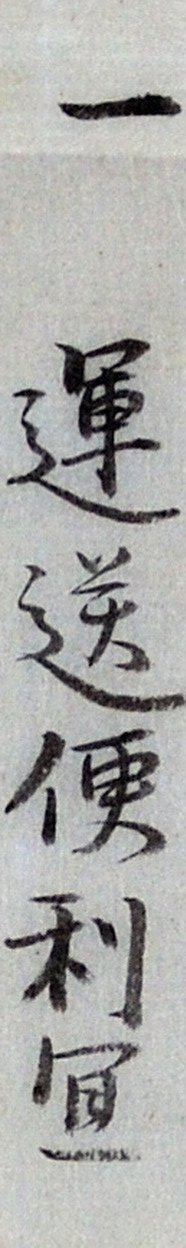一運送便利宜
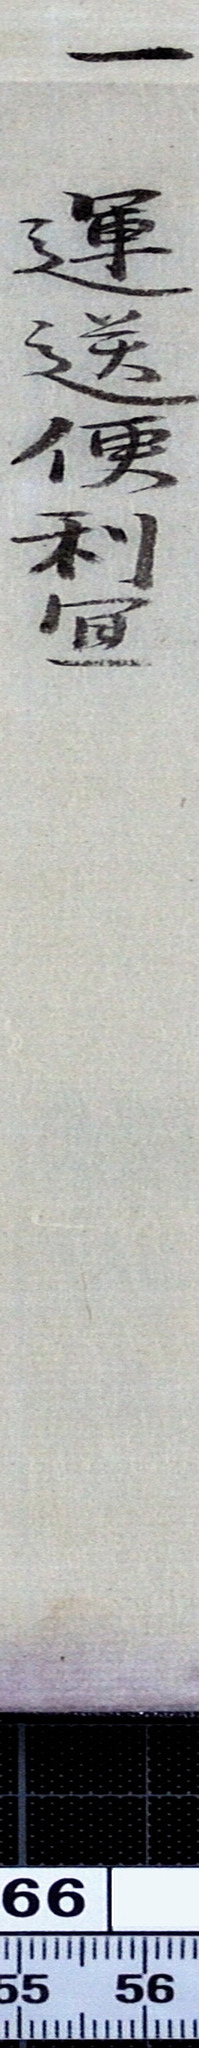一運送便利宜
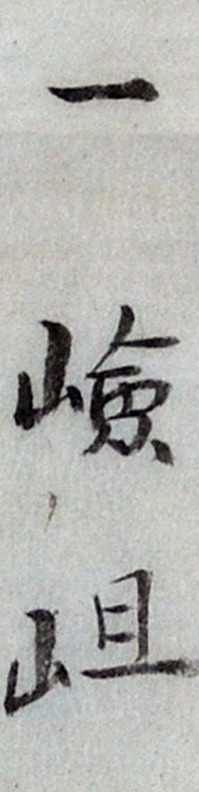一嶮岨
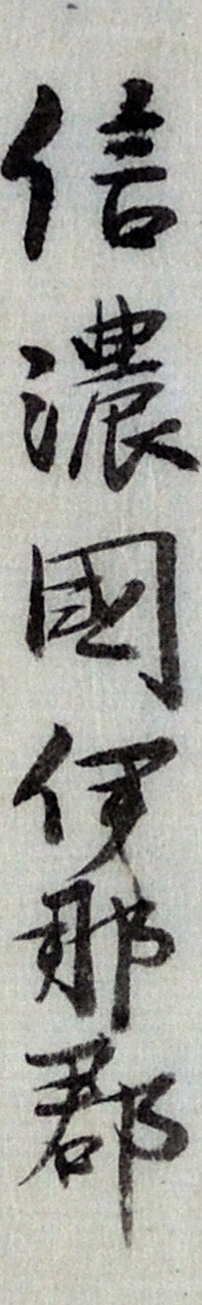信濃国伊那郡
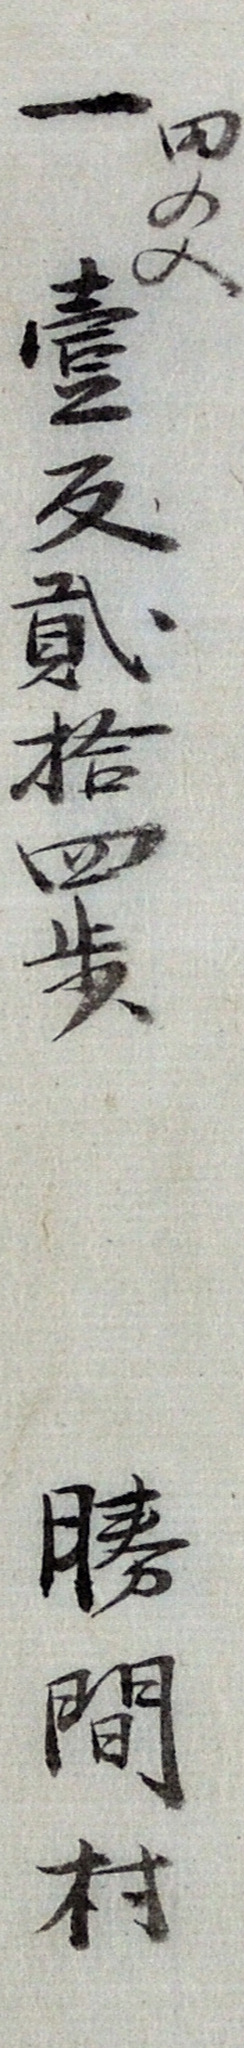一壱反弐拾四歩勝間村
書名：官林反別帳
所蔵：伊那市立高遠町図書館・合同会社AMANE
